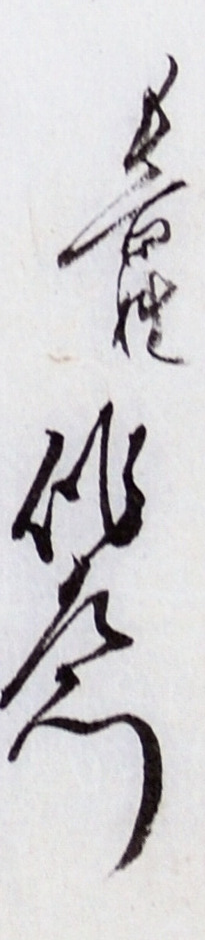長百姓作左衛門
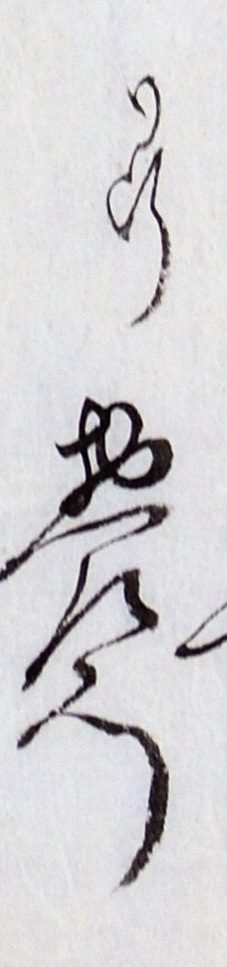同断惣左衛門
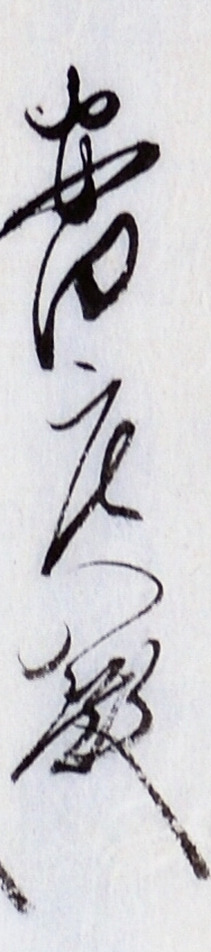安田庄八殿
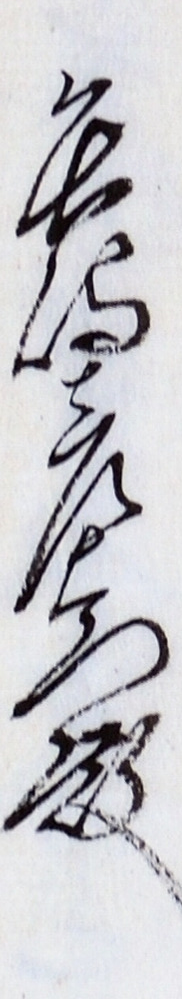矢嶋彦右衛門殿
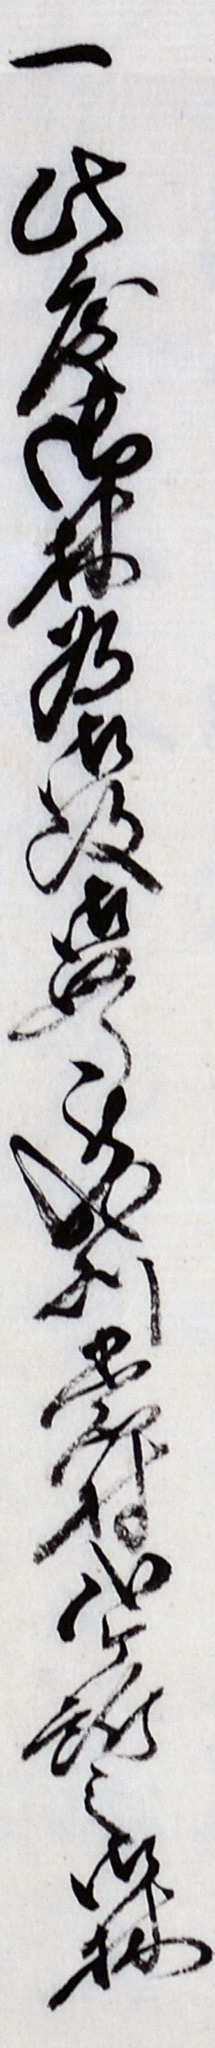一此度御林為御改御廻り被成則当村弐ヶ所之御林
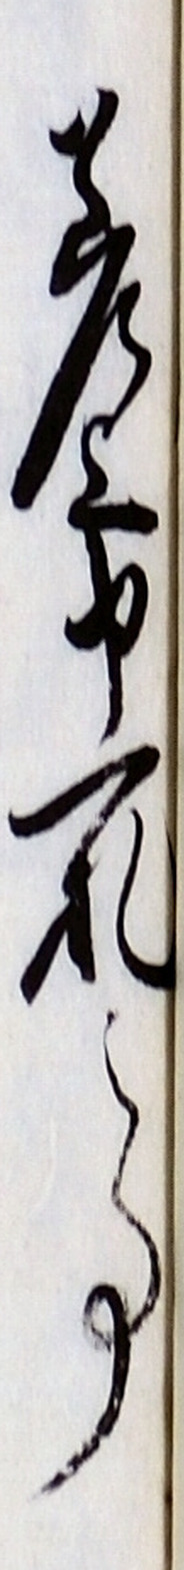差上申一札之事
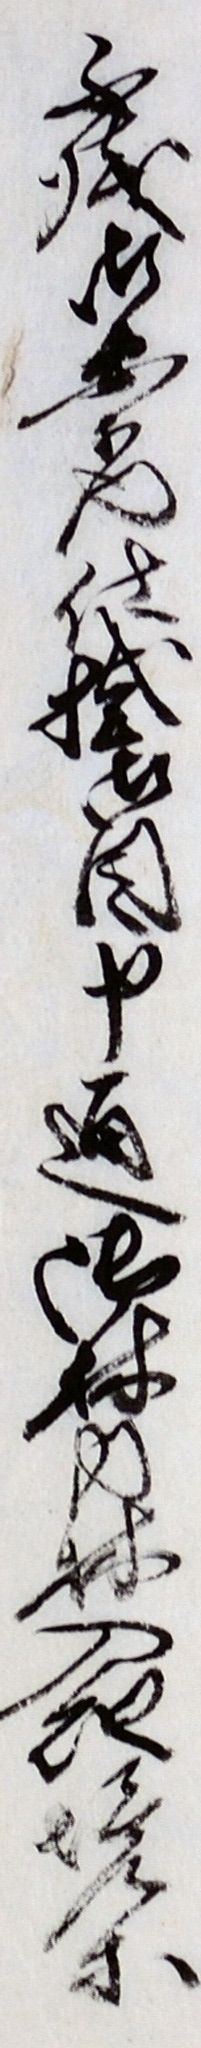不残御案内仕掛御目申通御林内林入組境等
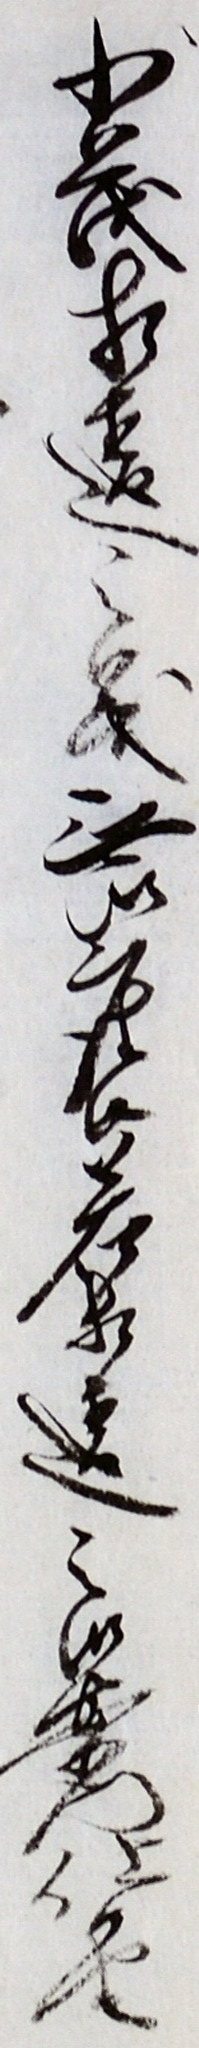少も相違之義無御座候若相違之御案内仕候由
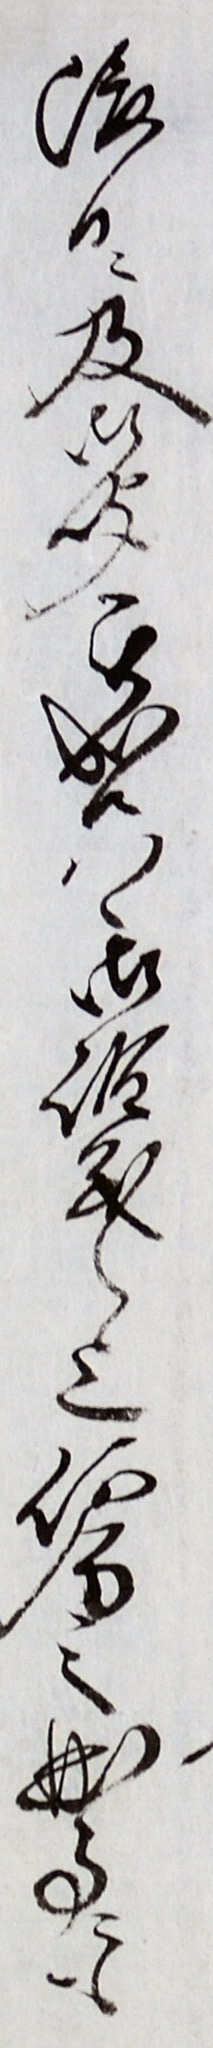後日ニ及御聞被成候ハヽ御詮義之上何分之曲事ニも
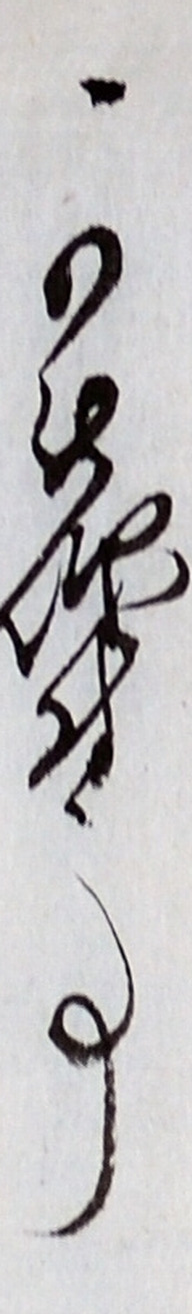可被仰付事
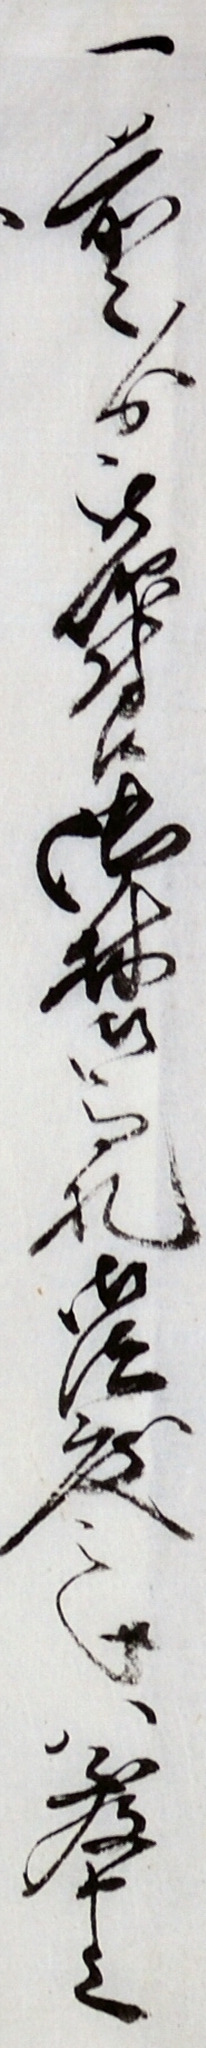一前々ゟ被仰付候御林御高札御法度之趣ハ不及申上
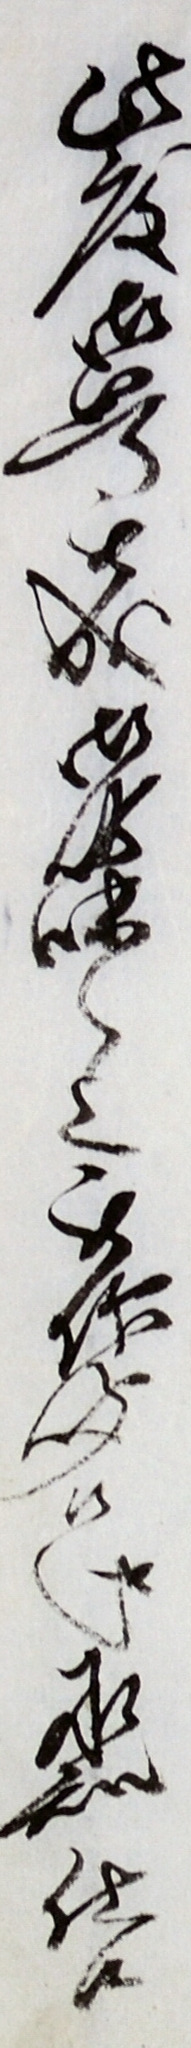此度御廻り被成御吟味之上被仰聞候趣承知仕候

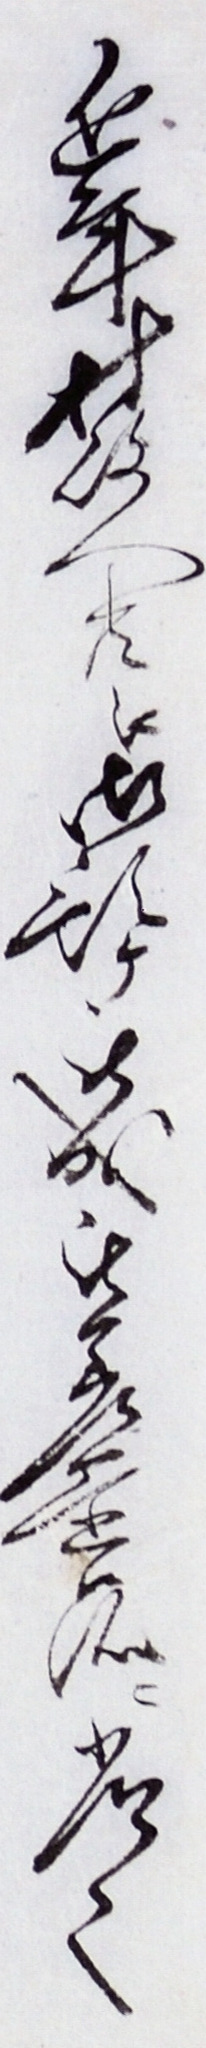近年村役人共え御預ヶ被成被差置候所ニ常々
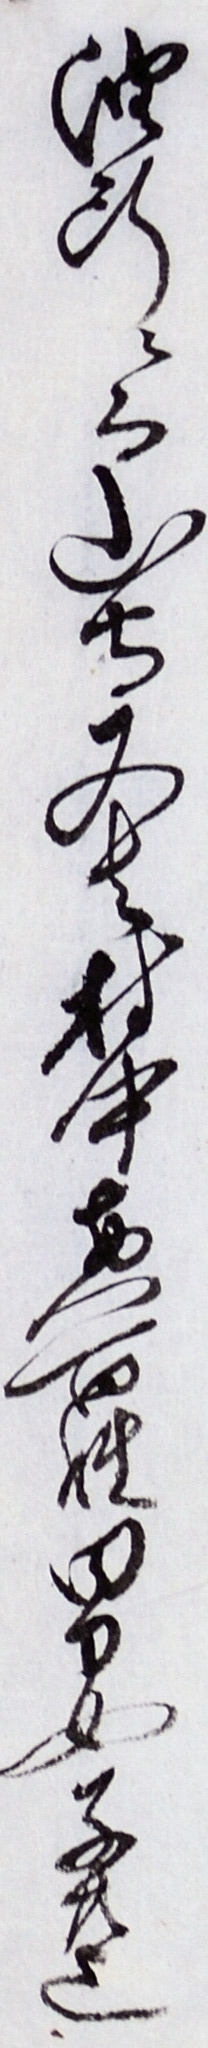油断ニ而山守又は村中惣百姓男女子共迄
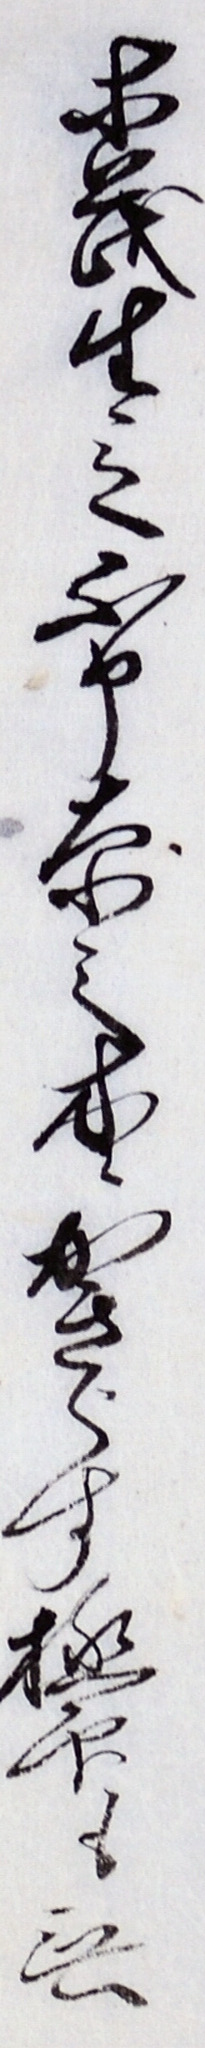等茂生立不申大小之木ニかきらす極印も無
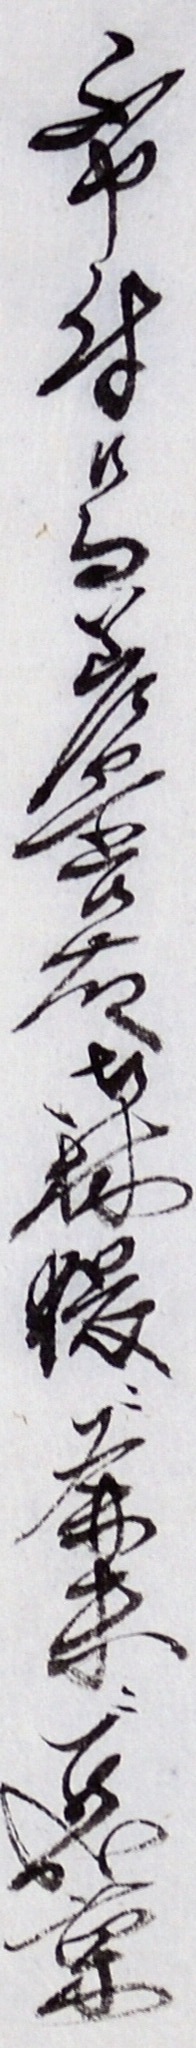不申付候而差置候故御林猥ニ麁末ニ罷成苗木
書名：御林御竹藪証文控
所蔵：伊那市立高遠町図書館・合同会社AMANE
